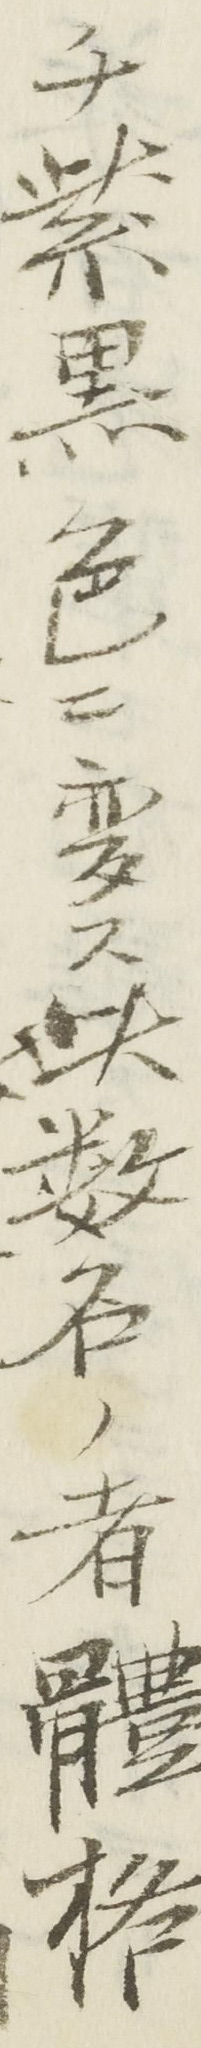チ紫黒色ニ変ス此数名ノ者体格
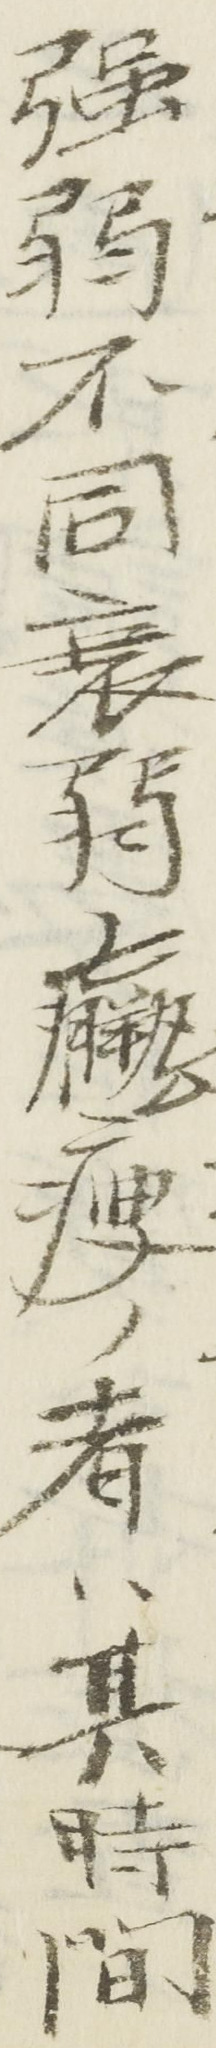羸む強弱不同衰弱羸痩ノ者ハ其時間
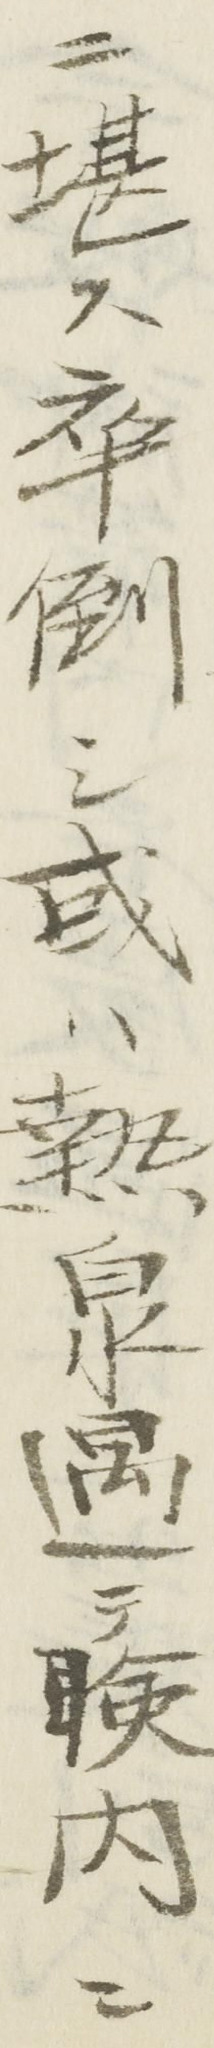ニ堪ス卒倒シ或ハ熱泉過テ瞼内ニ
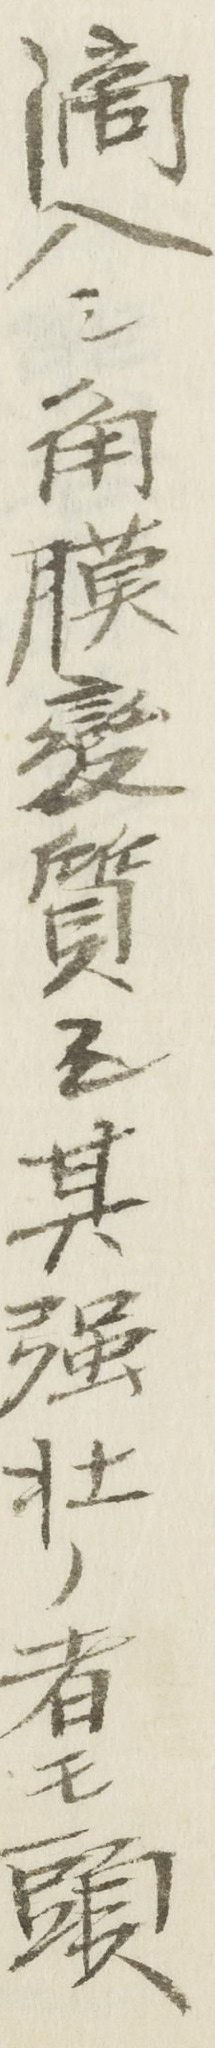滴入シ角膜変質ス其強壮ノ者モ頭
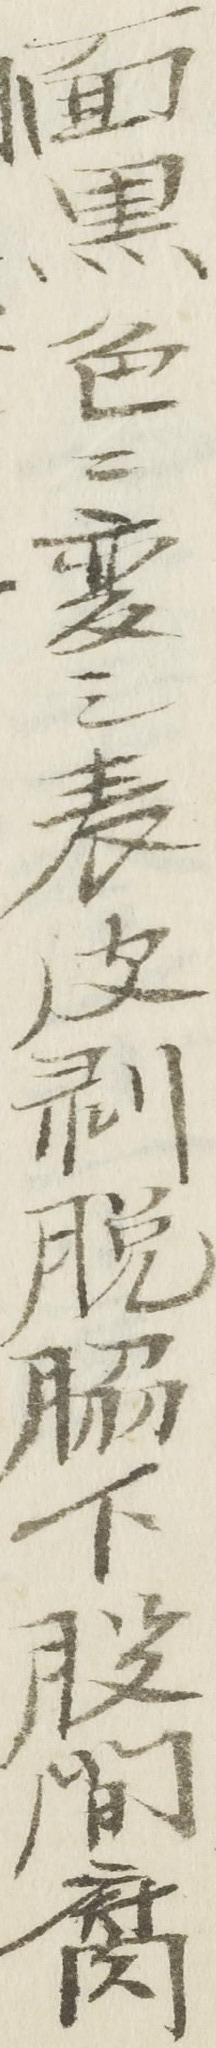面黒色ニ変シ表皮剥脱脇下股間腐
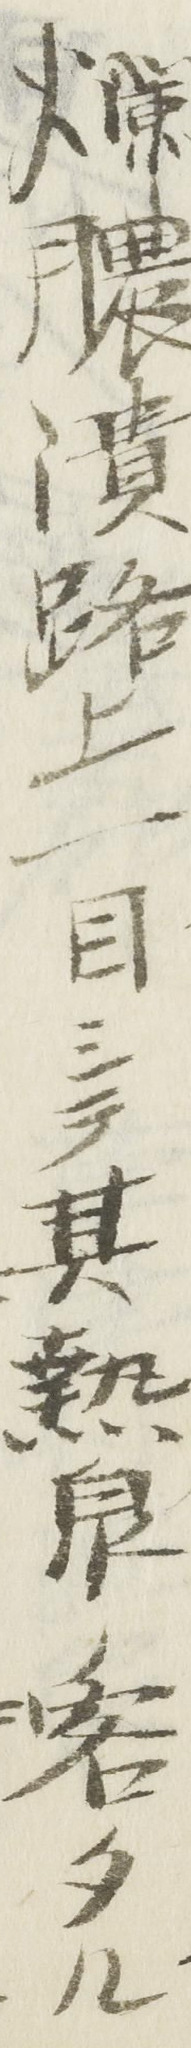爛膿潰路上一目シテ其熱泉ノ客タル
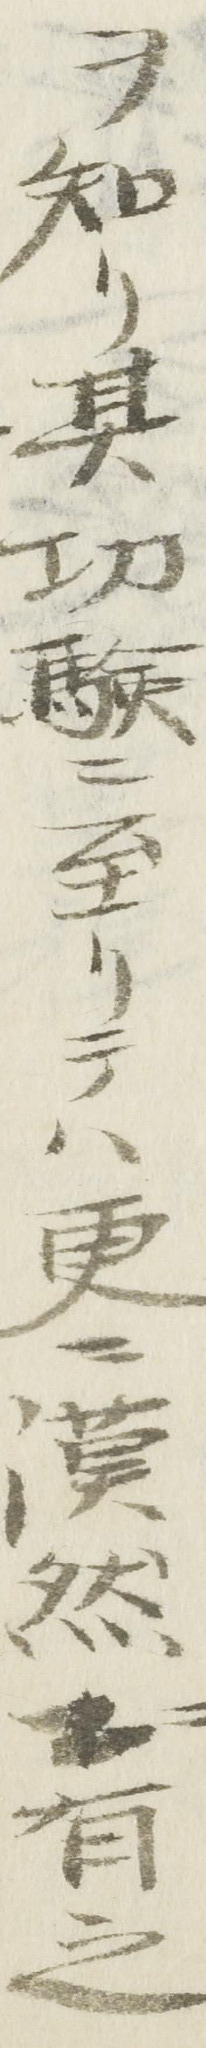ヲ知リ其功験ニ至リテハ更ニ漠然ニ有之
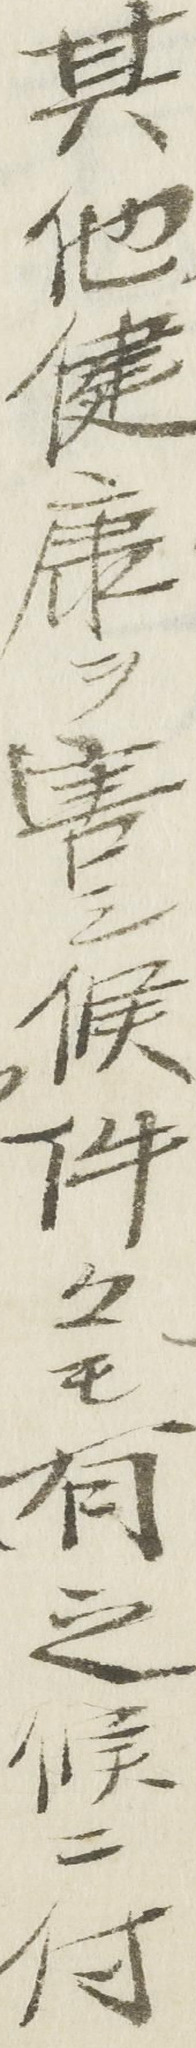其他健康ヲ害シ候件々モ有之候ニ付
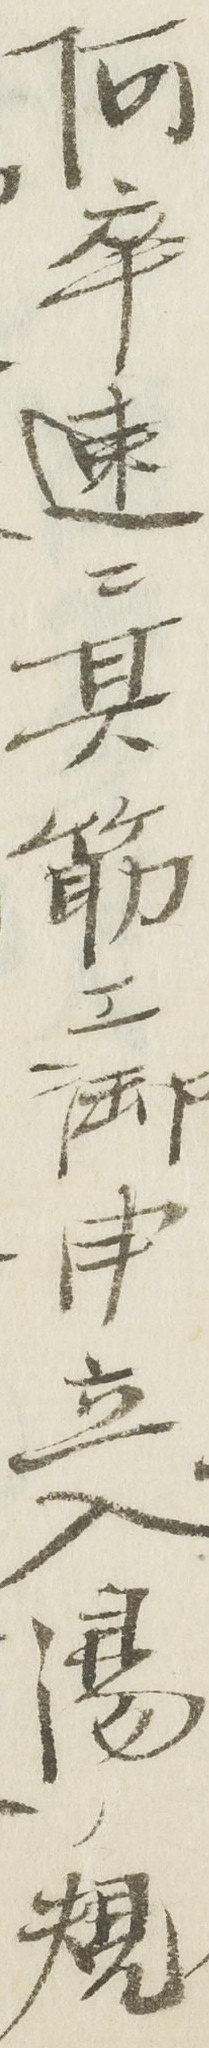何卒速ニ其筋エ御申立入湯ノ規
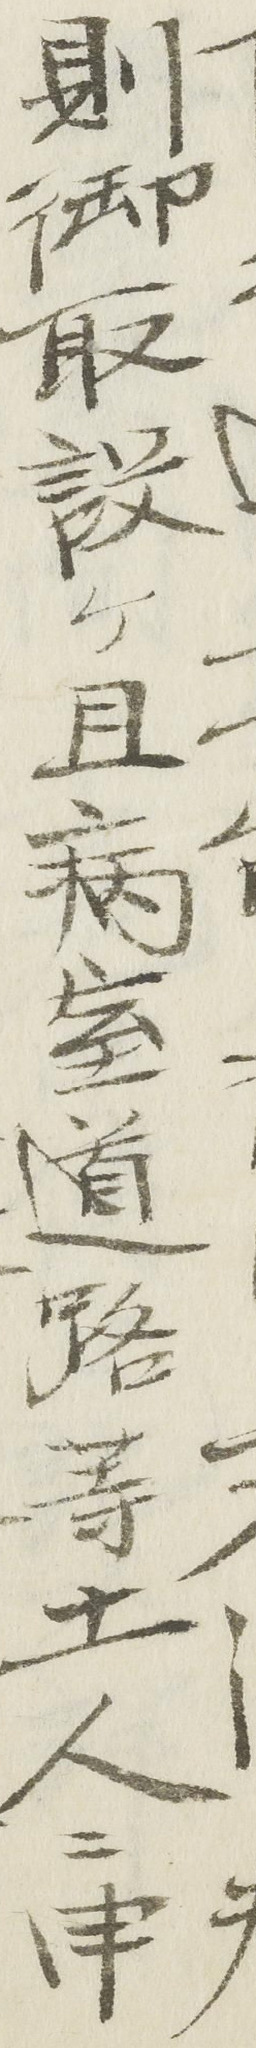則御取設ケ且病室道路等土人ニ申
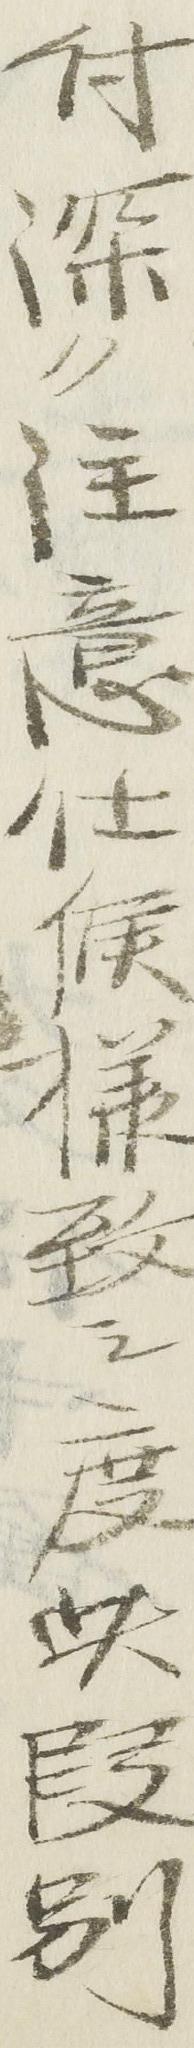付深ク注意仕候様致シ度此段別
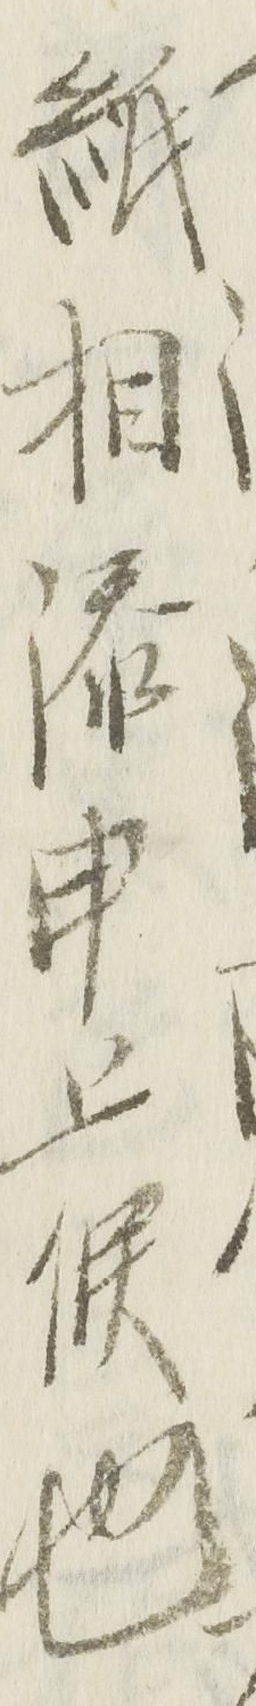紙相添申上候也

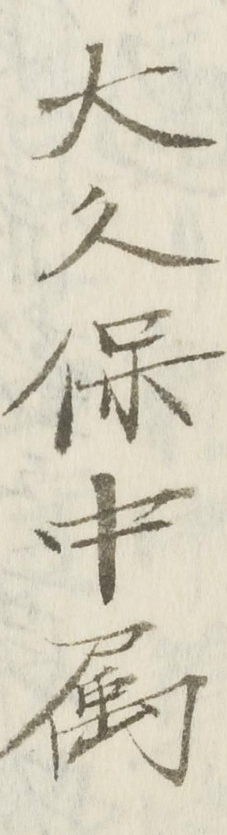大久保中属
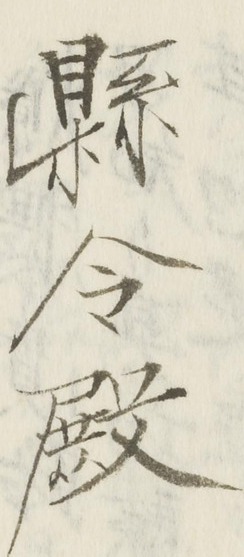縣令殿
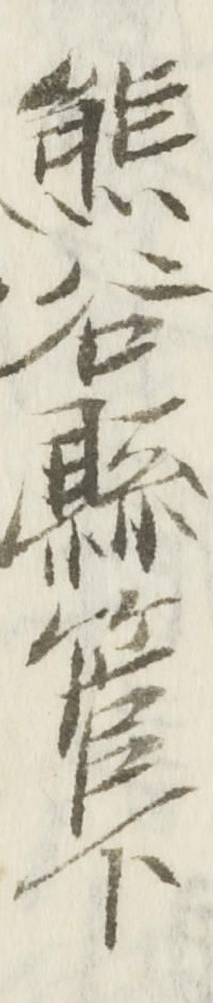熊谷縣管下
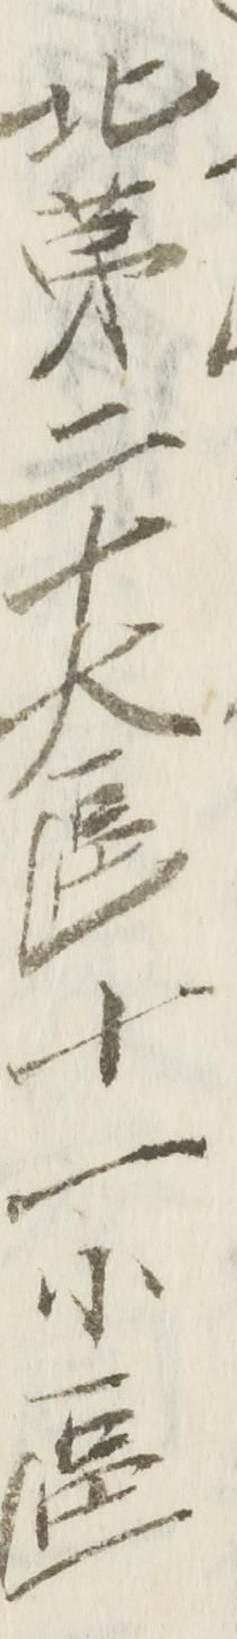北第二十大區十一小區
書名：温冷泉試験表
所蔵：東京大学地震研究所図書室 Earthquake Research Institute Library, The University of Tokyo, JAPAN
